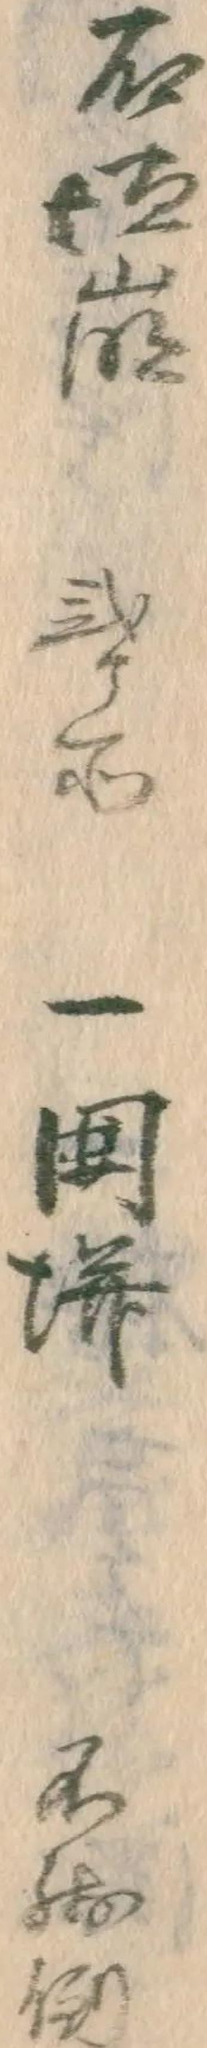一石垣崩弐ヶ所一囲塀不残倒
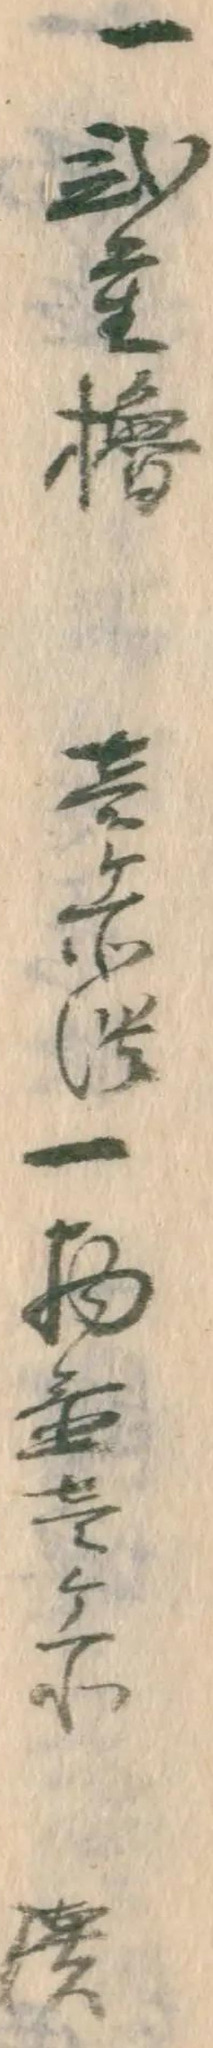一二重櫓壱ヶ所潰一物置壱ヶ所潰
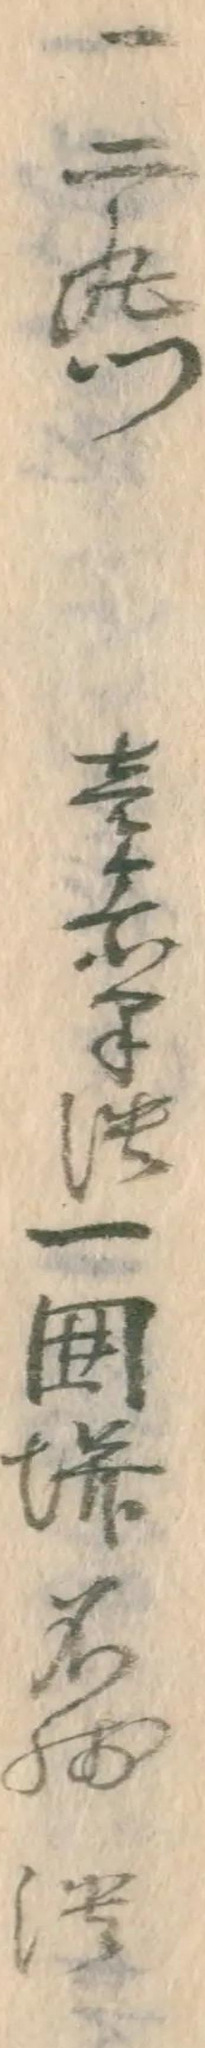一二ノ丸門壱ヶ所半潰一囲塀不残潰
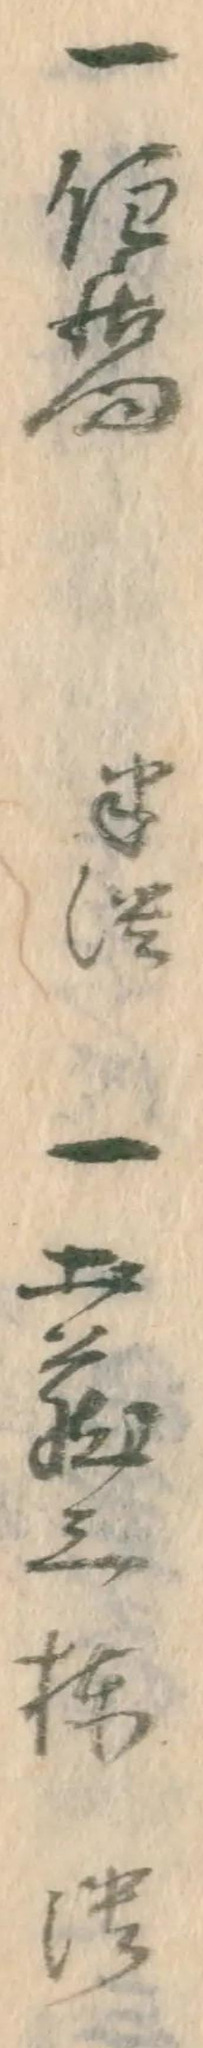一住居向半潰一土蔵三棟潰

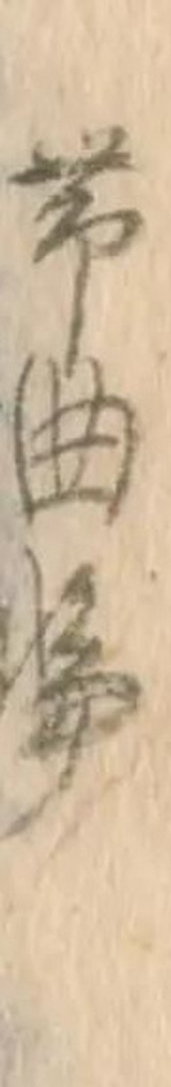西曲輪
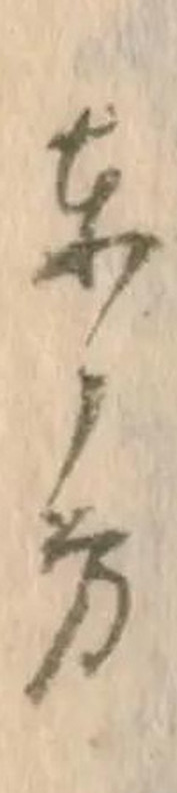東ノ方
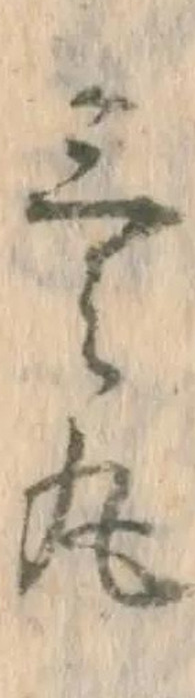三之丸
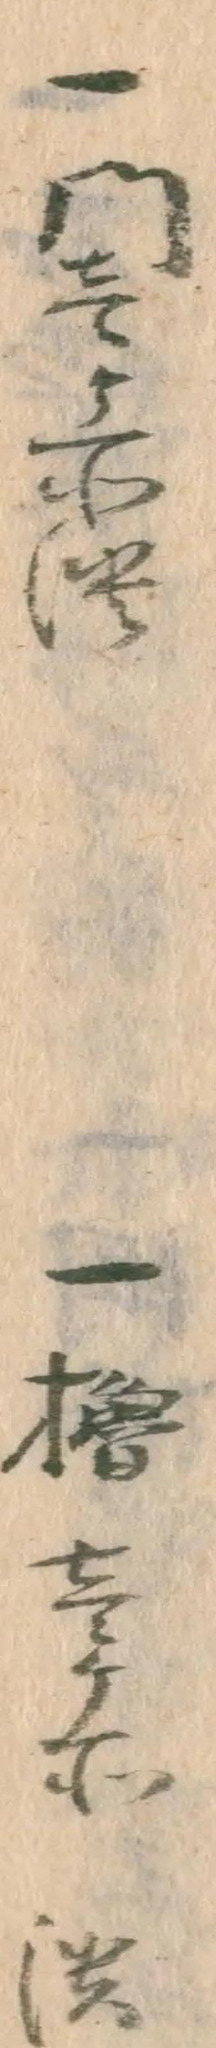一門壱ヶ所潰一櫓壱ヶ所潰
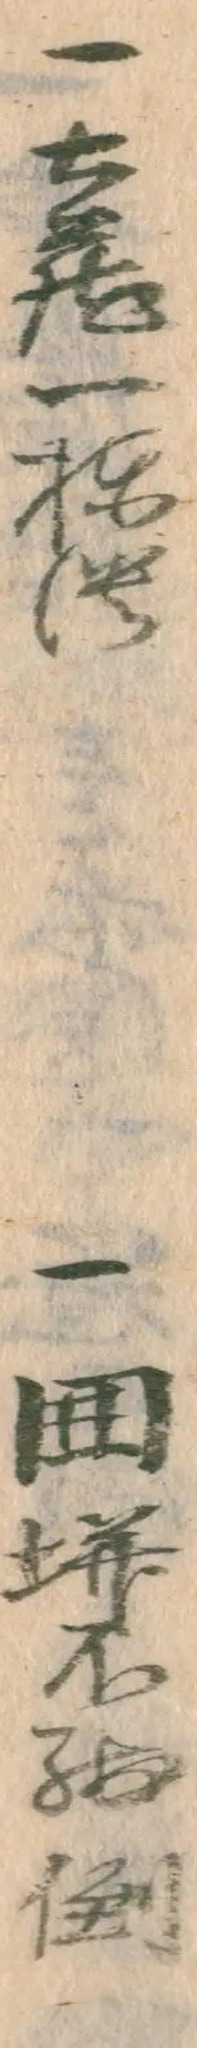一土蔵一棟潰一囲塀不残倒
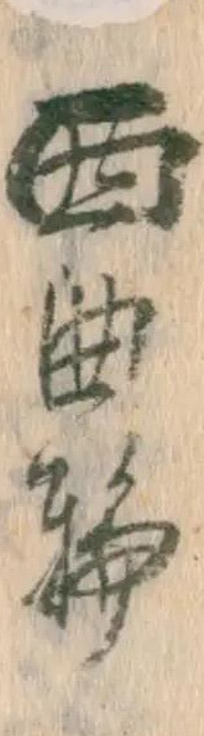西曲輪
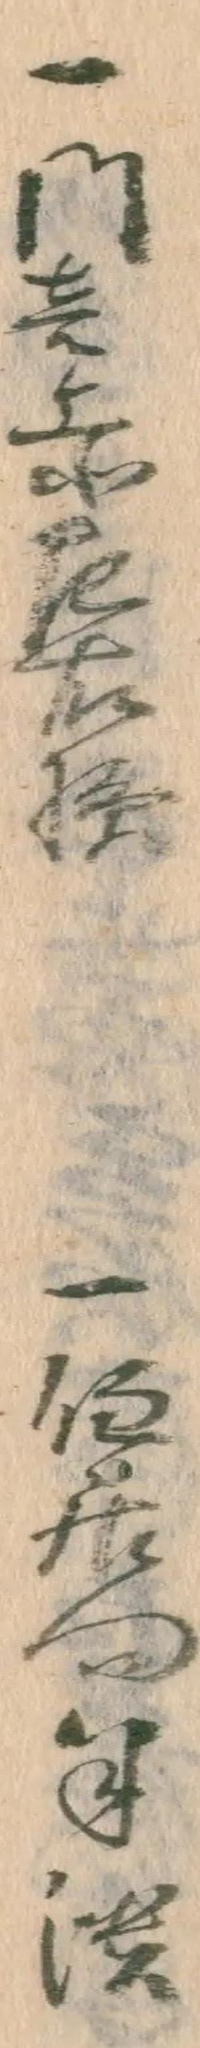一門壱ヶ所左右損一住居向半潰
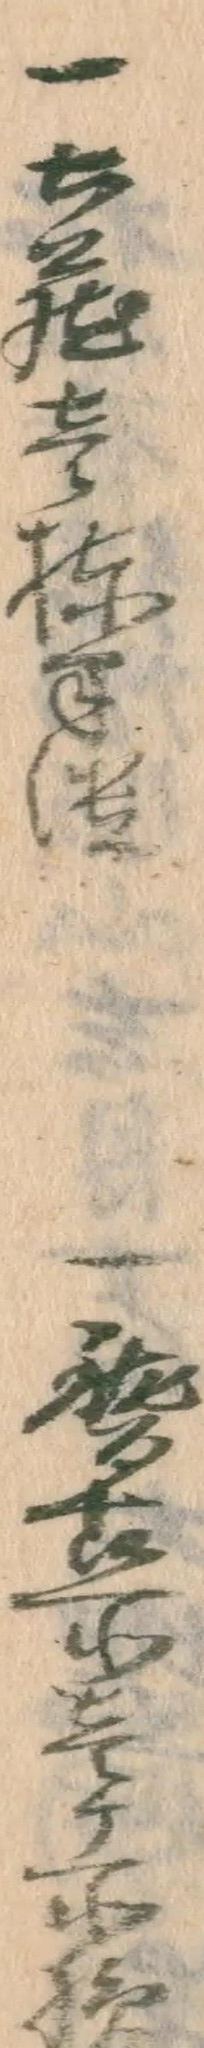一土蔵壱棟半潰れ一稽古所壱ヶ所損
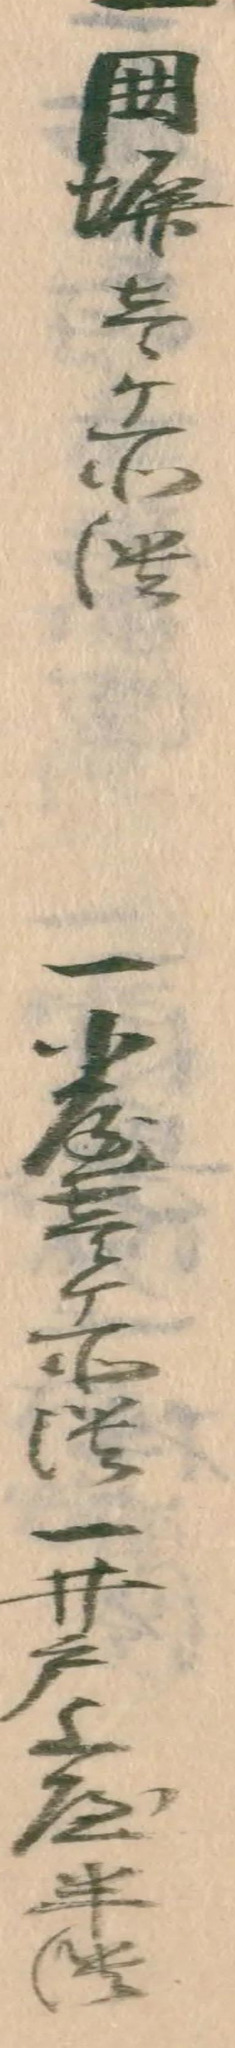一囲塀壱ヶ所潰一小屋壱ヶ所潰一井戸上屋半潰
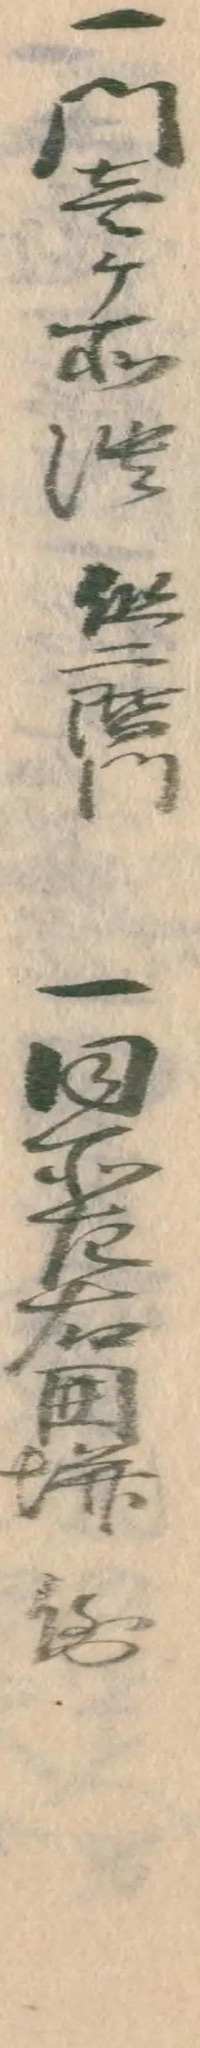一門壱ヶ所潰但二階門一同所左右囲塀倒
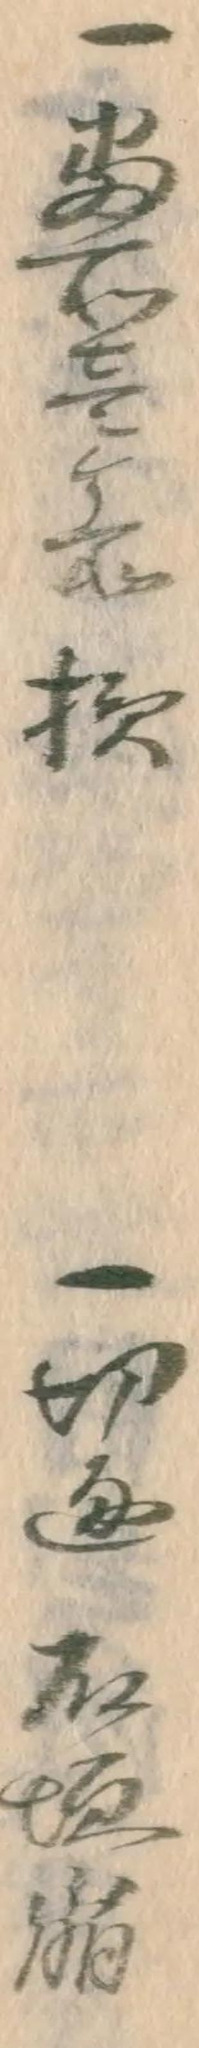一番所壱ヶ所損一切通石垣崩
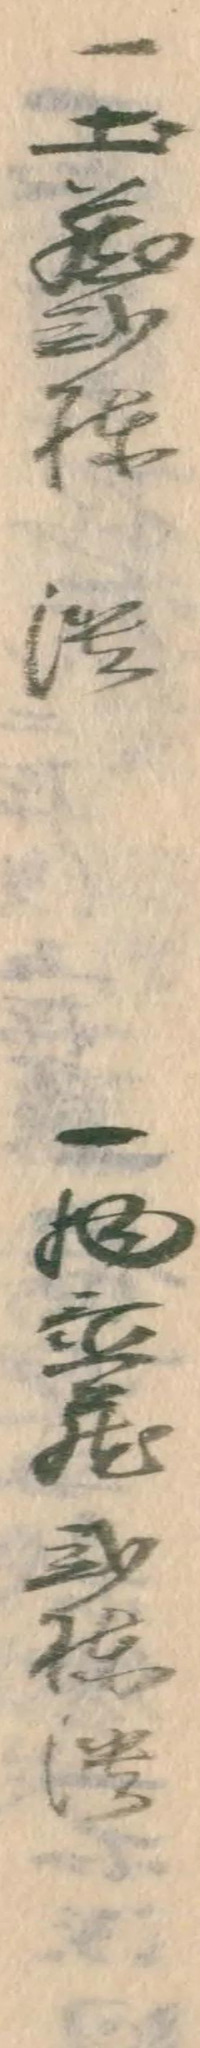一土蔵弐棟潰一物置蔵弐棟潰
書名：信州大地震之記
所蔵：国立国会図書館 National Diet Library, JAPAN
